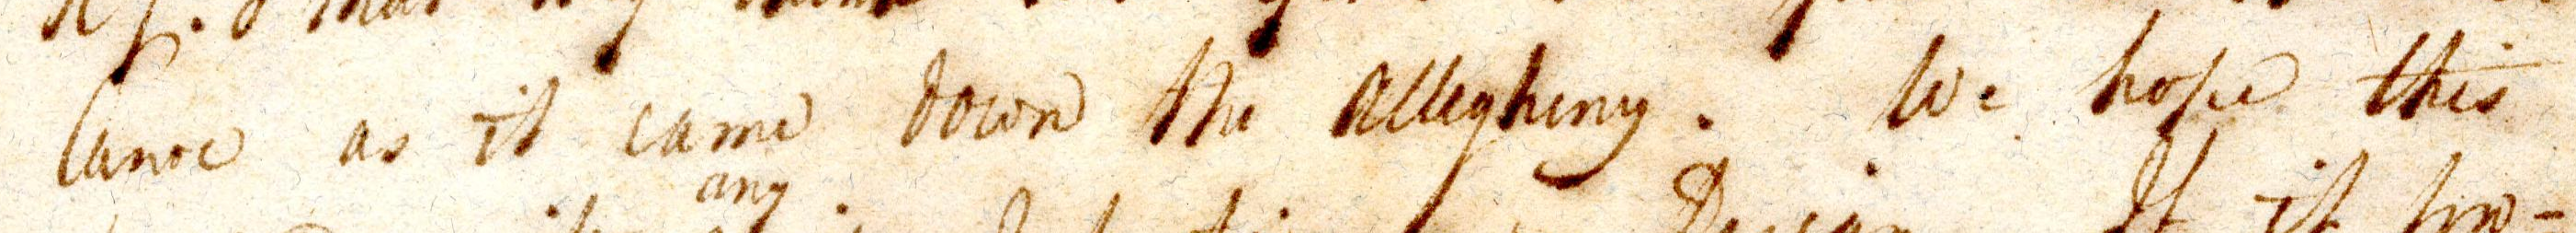Canoe as it came down the Allegheny. We hope this
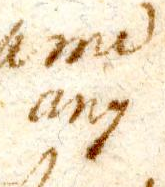any
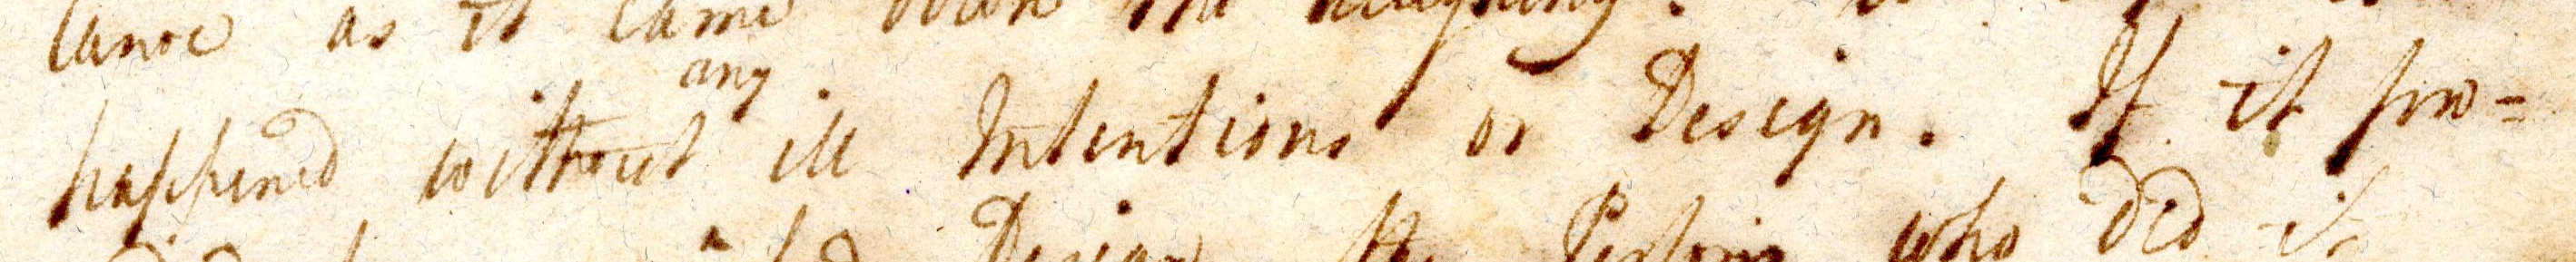happened without^ ill Intentions or Design. If it pro-
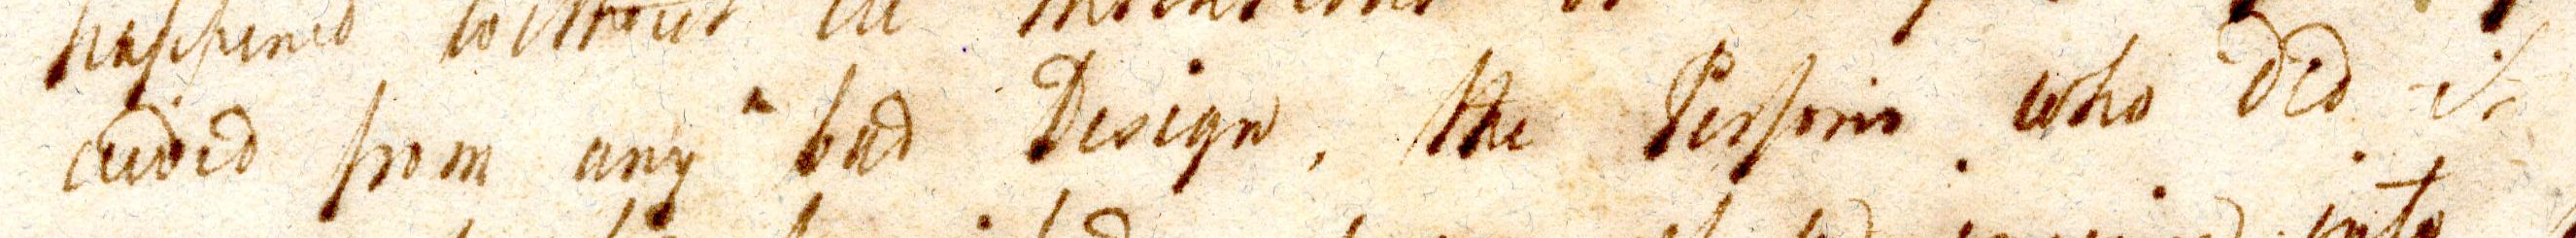ceded from any bad Design, the Person who did so
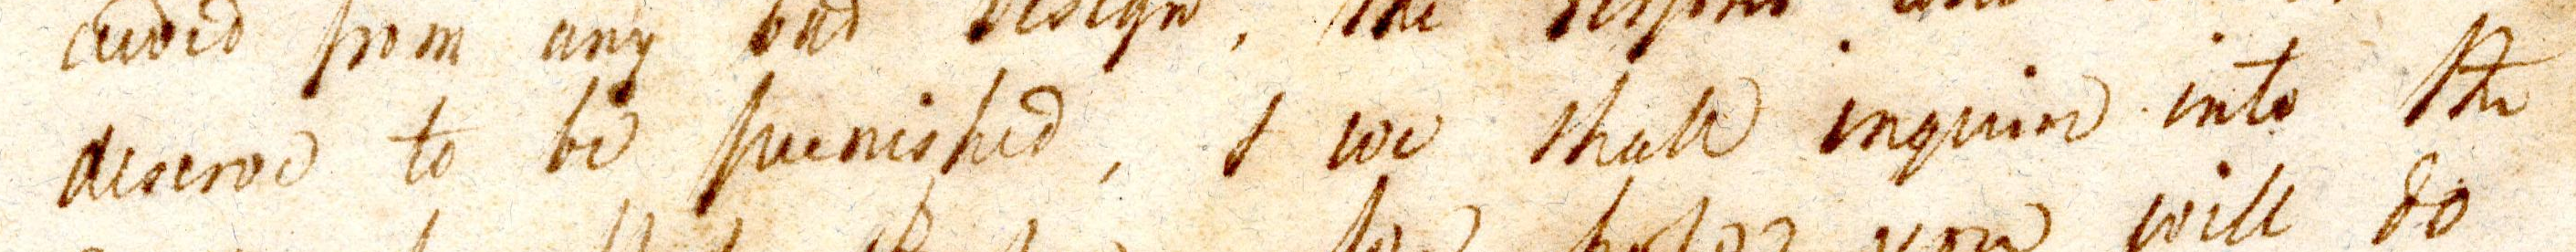deserved to be punished, & we shall inquire into the
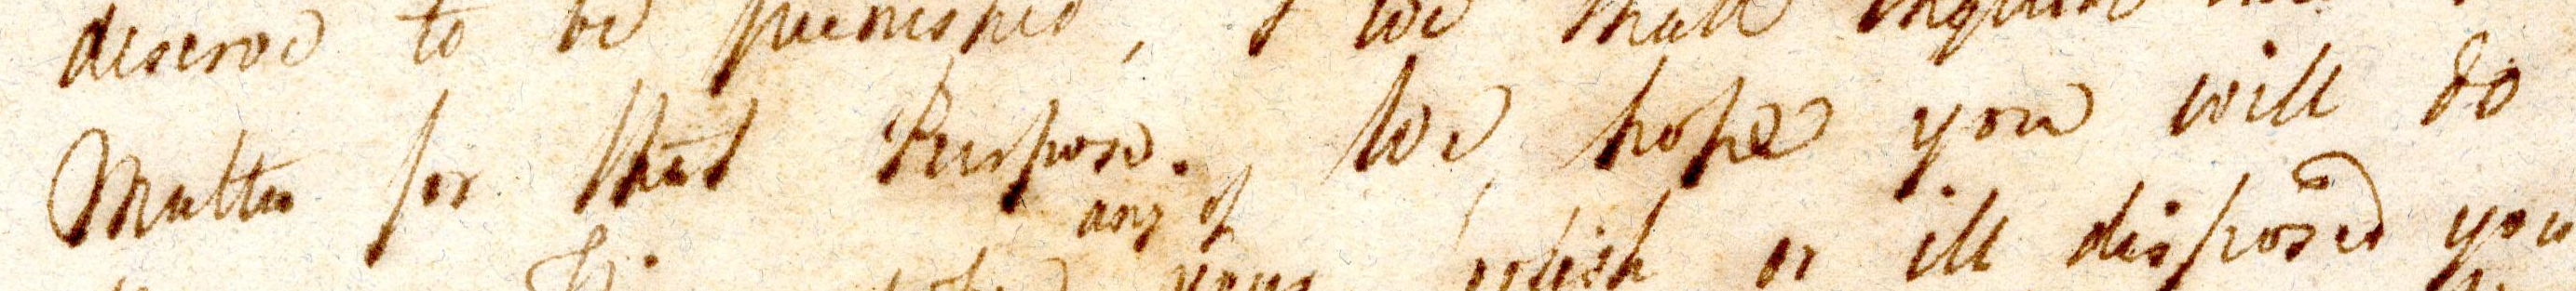Matter for that Purpose. We hope you will do
